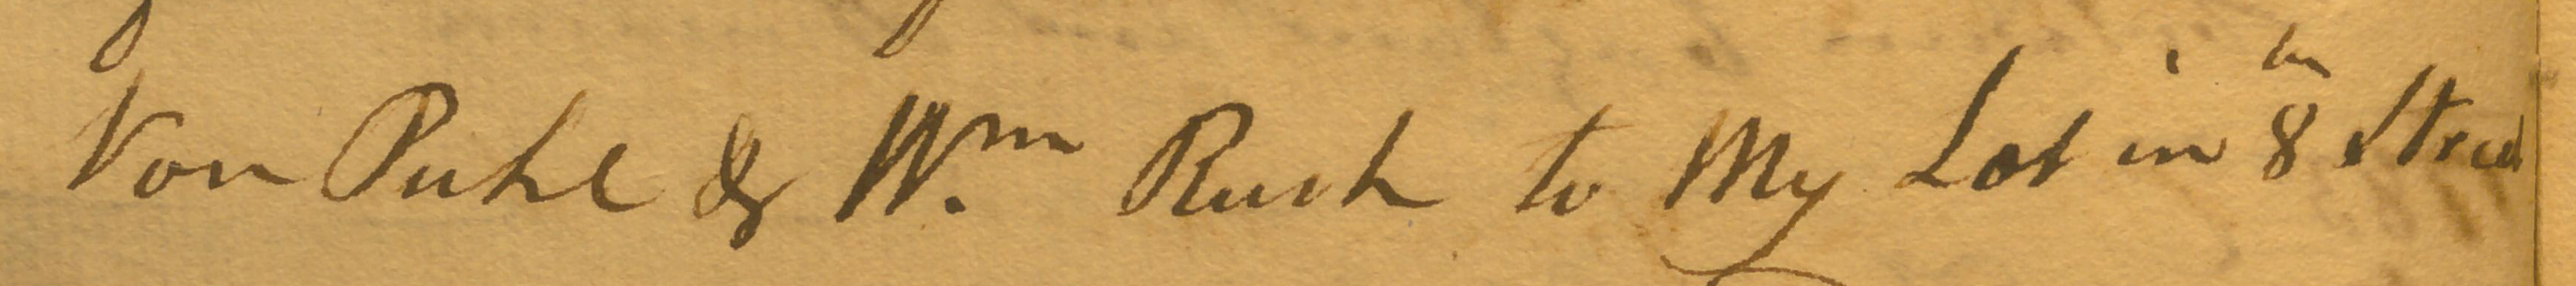Von Puhl & W^m. Rush to My Lot in 8^th Street
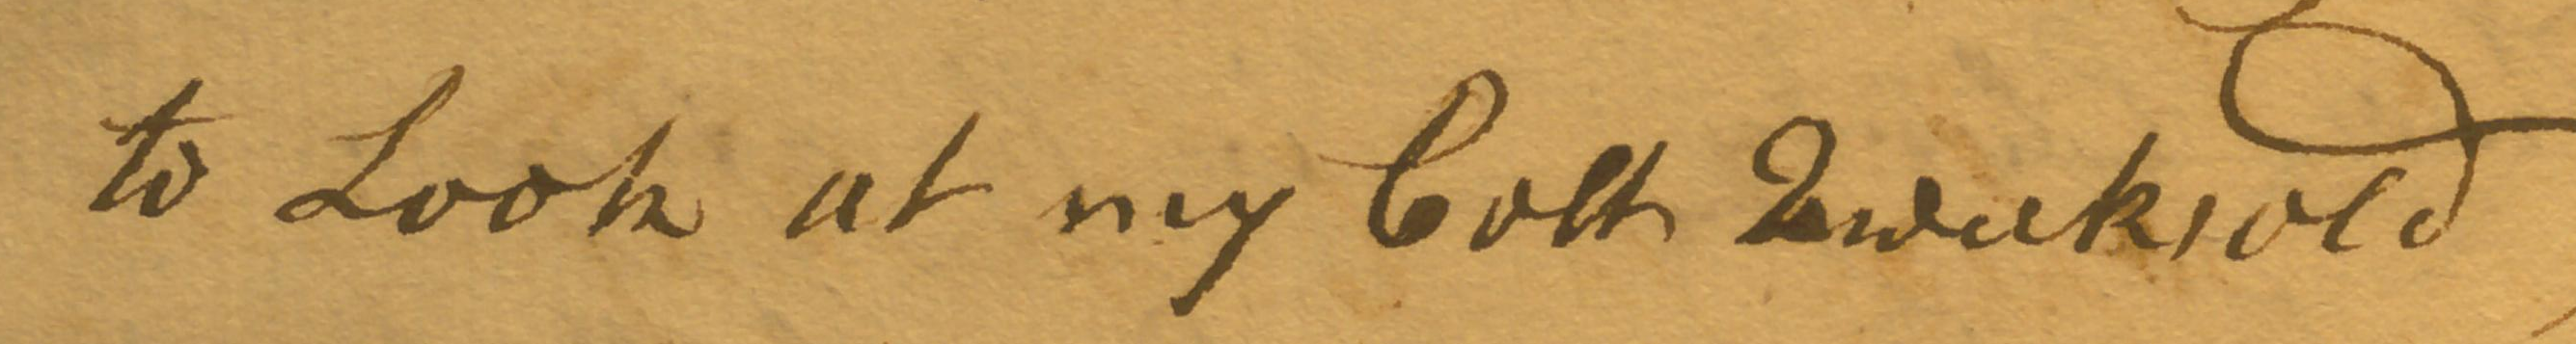to Look at my Colt 2 weeks old
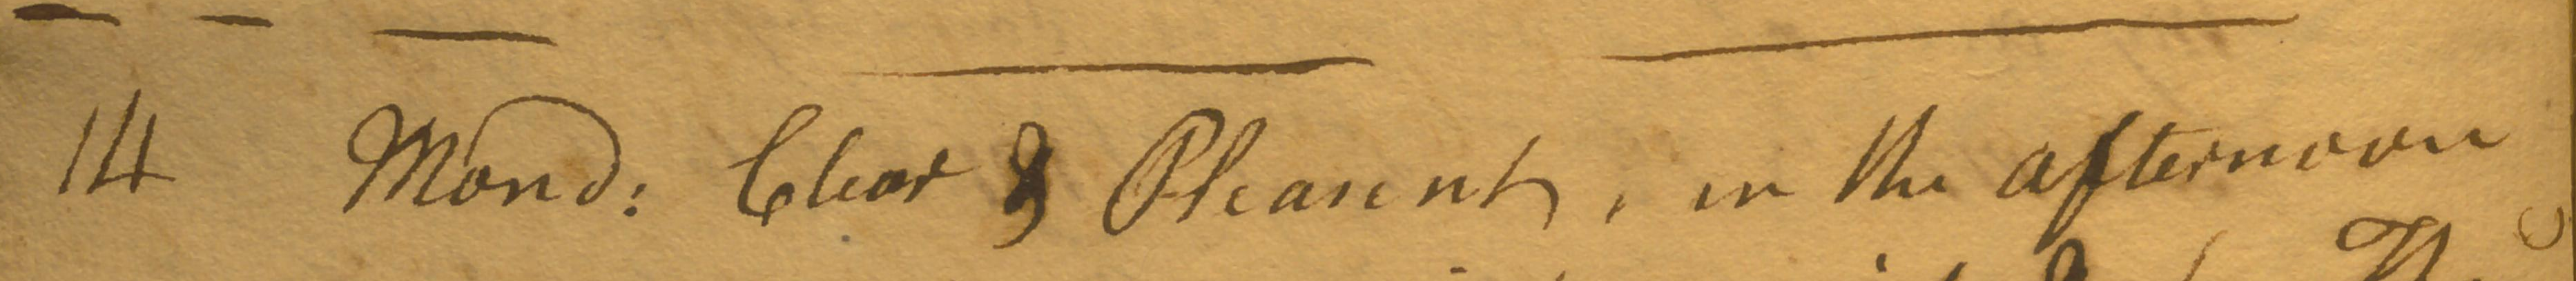14 Mond. Clear & Pleasent, in the afternoon
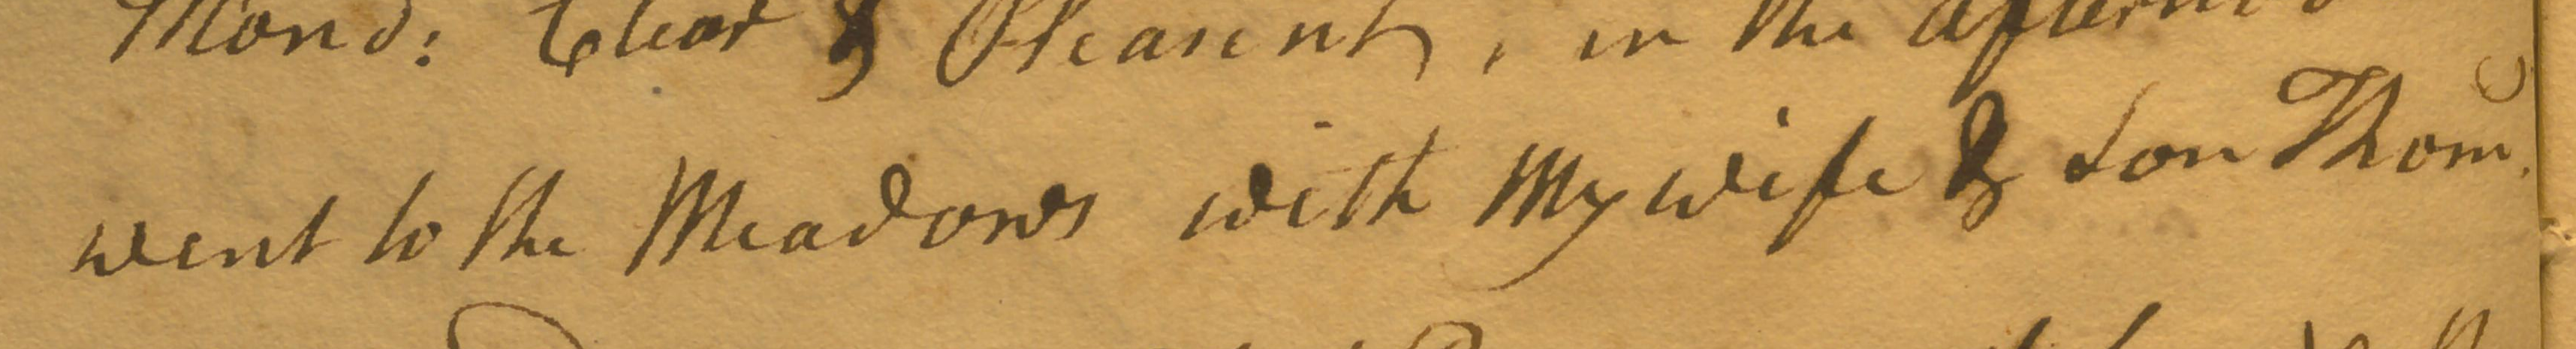went to the Meadows with My wife & son Thom
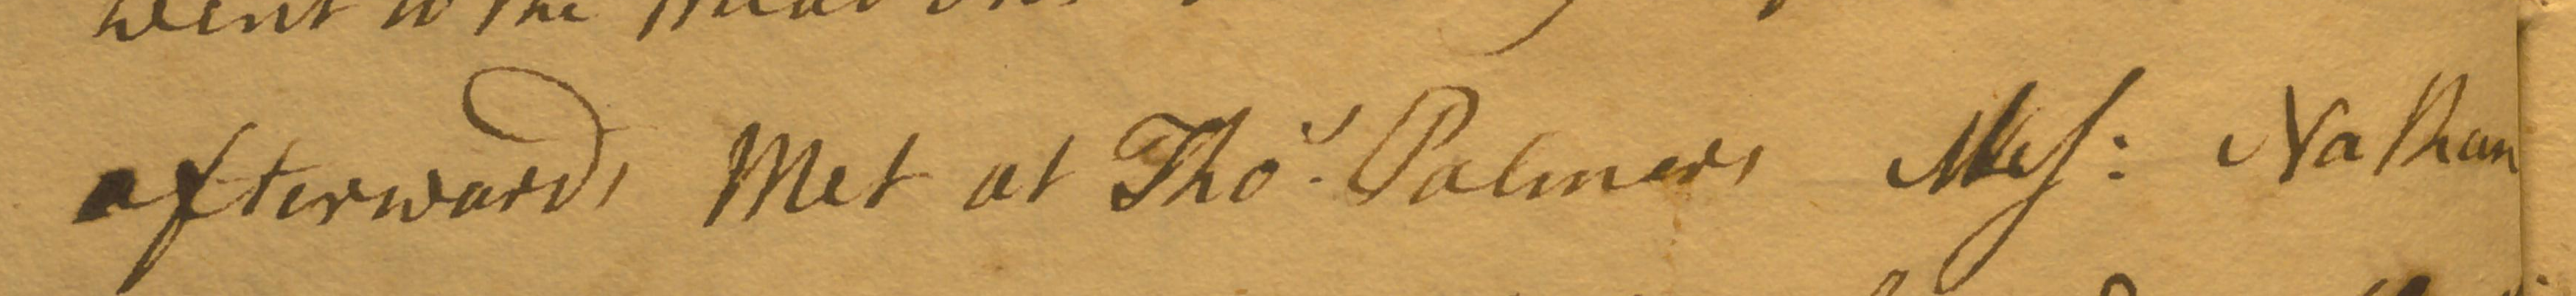afterwards Met at Tho^s. Pakmers Mes: Nathan
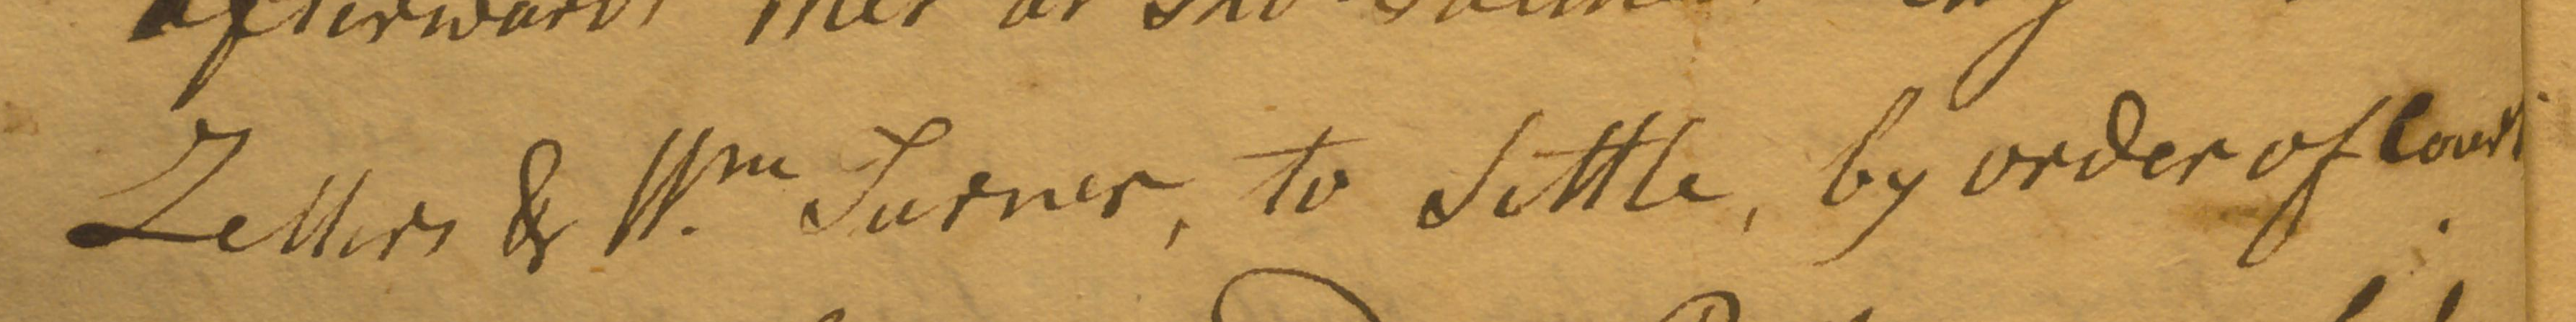Zellers & W^m. Turner, to Settle, by order of Court
